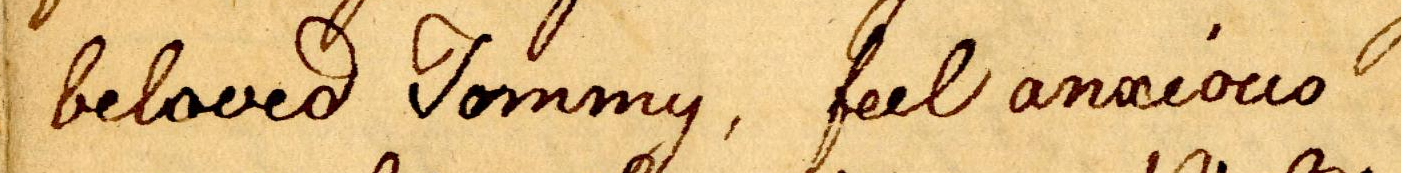beloved Tommy, feel anxious
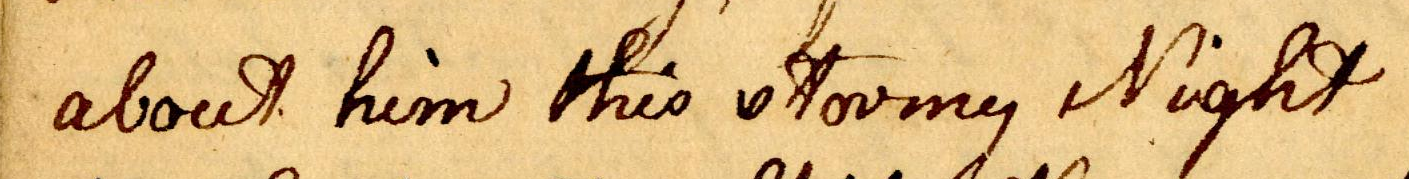about him this stormy Night
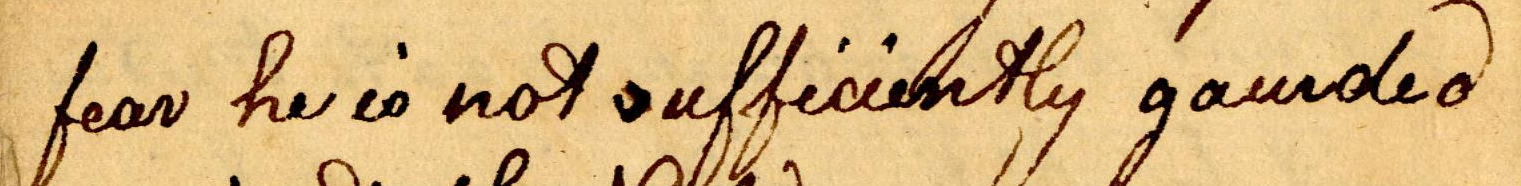fear he is not sufficiently gaurded
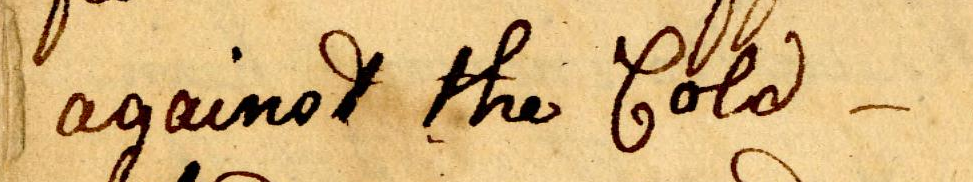against the Cold-
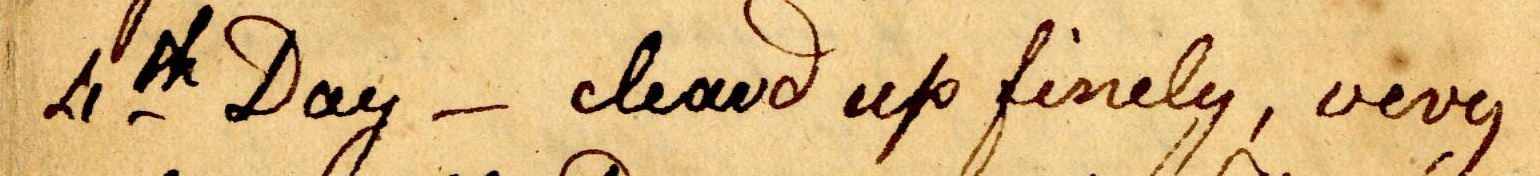4^th Day- cleard up finely, very
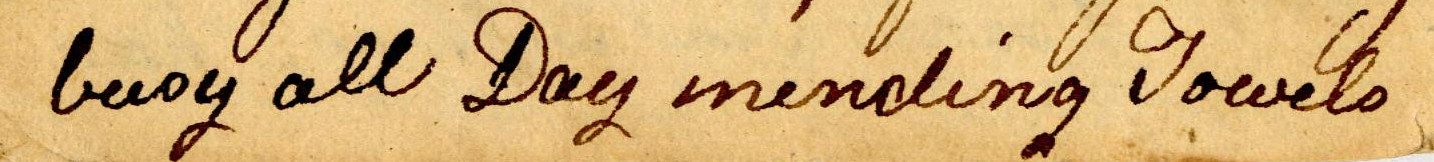busy all Day mending Towels
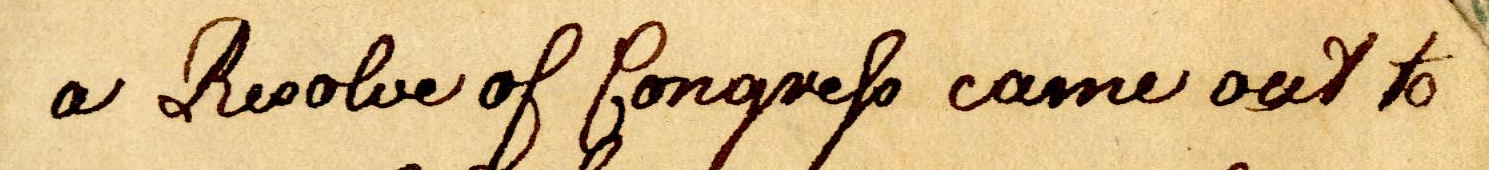a Resolve of Congress came out to
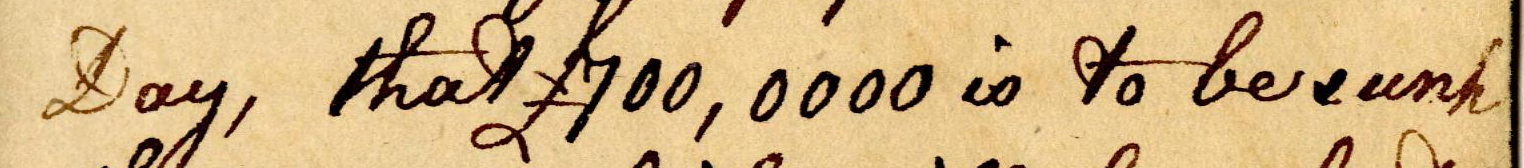Day, that 700, 0000 sterlings is to be sunk
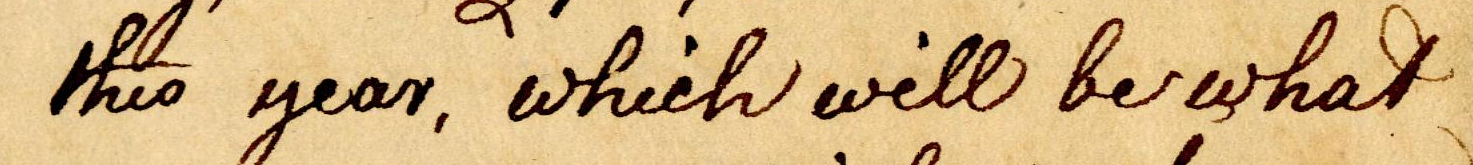this year, which will be what
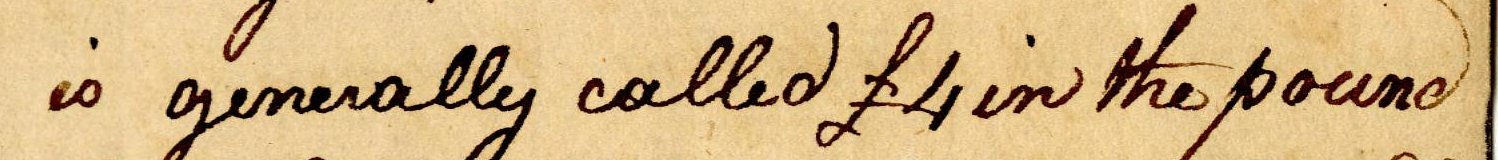is generally called £4 in the pound
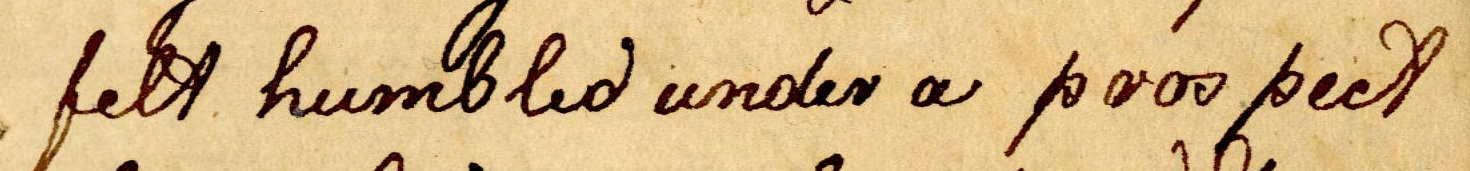felt humbled under a prospect
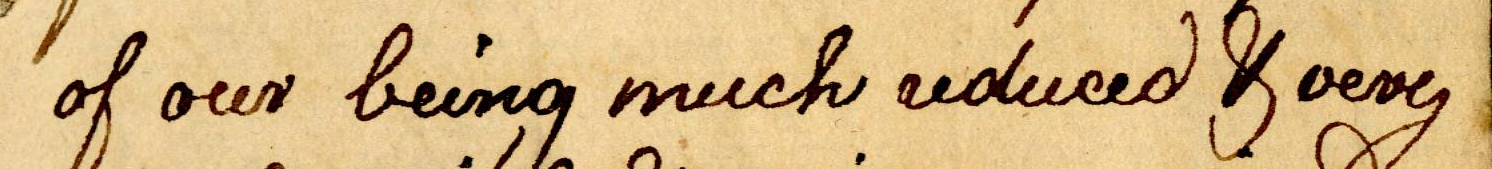of our being much reduced & very
